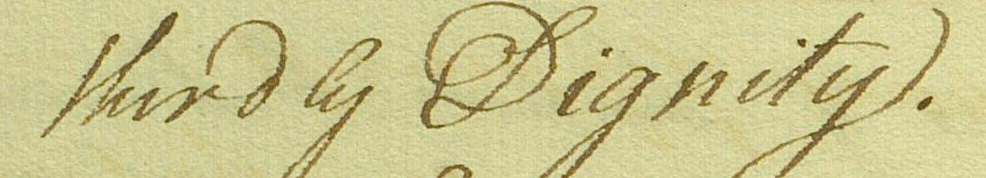thirdly Dignity.
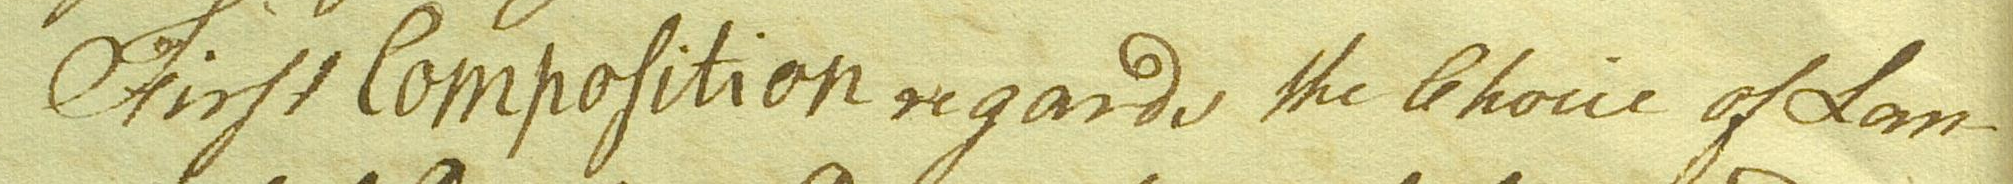First Composition regards the Choice of Lan-
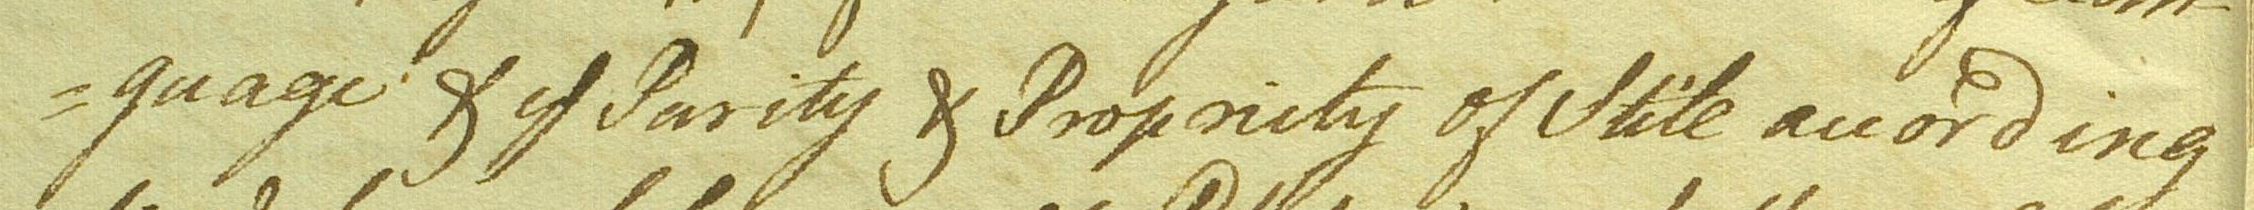-guage & of Purity & Propriety of Stile according
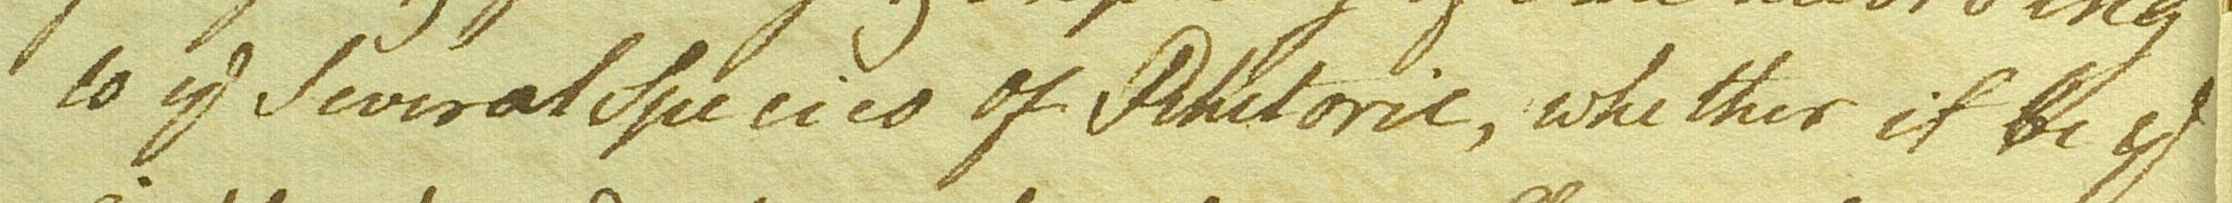to y^e Several Species of Rhetoric, whether it be y^e
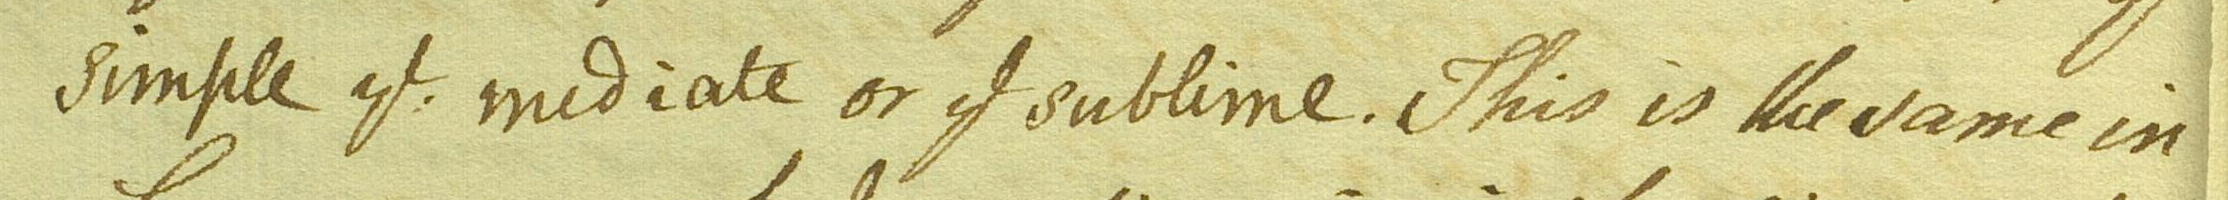simple y^e mediate or y^e sublime. This is the same in
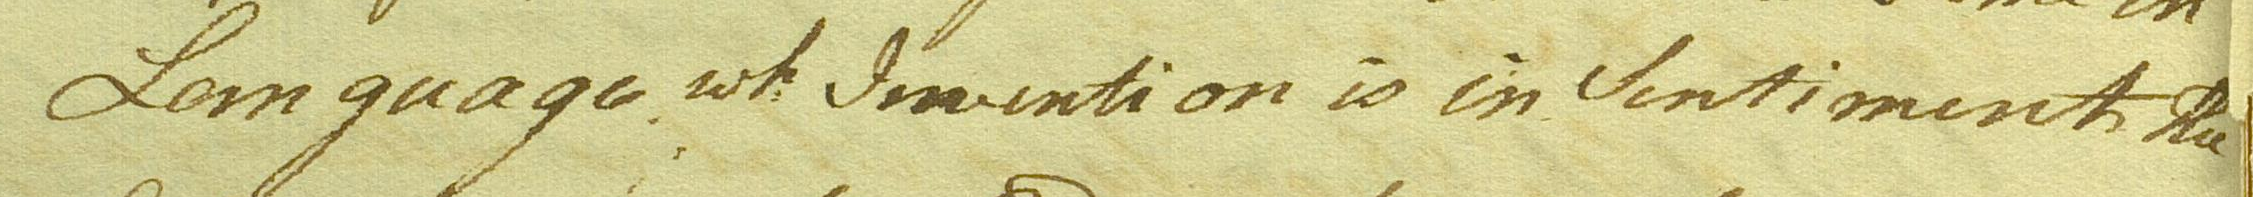Language w^h Invention is in Sentiment. The
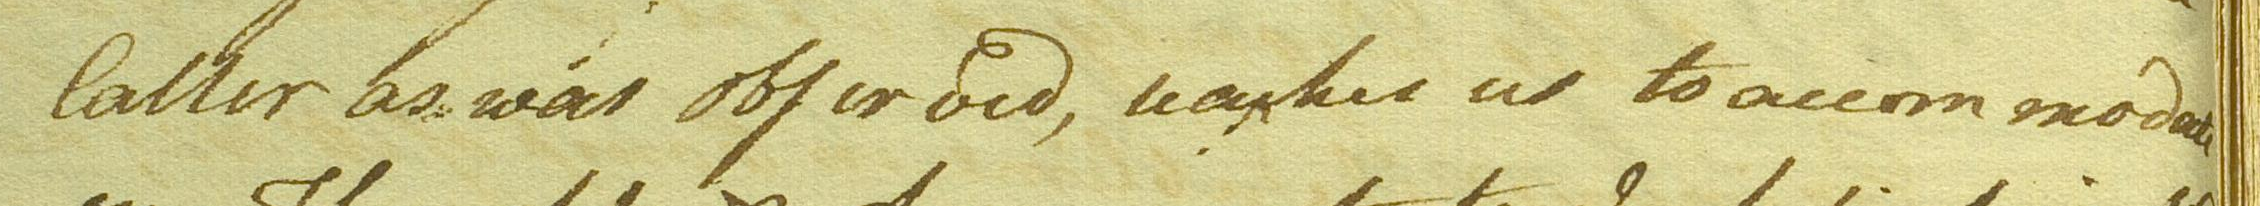latter as was observed, teaches us to accommodate
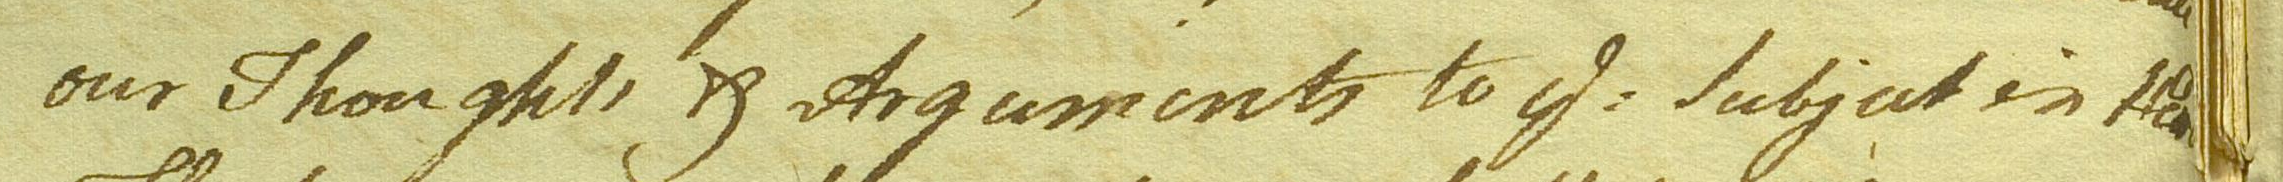our Thoughts & Arguments to y^e: Subject in Hand
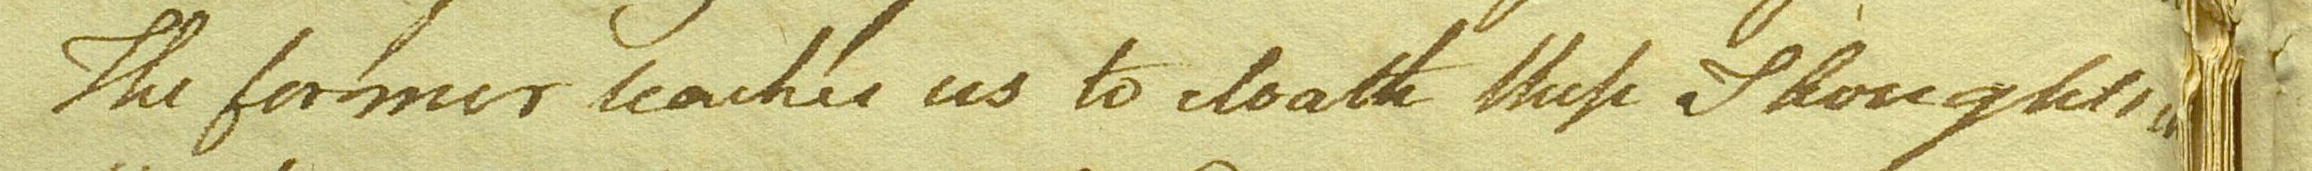The Former teaches us to cloathe these Thoughts
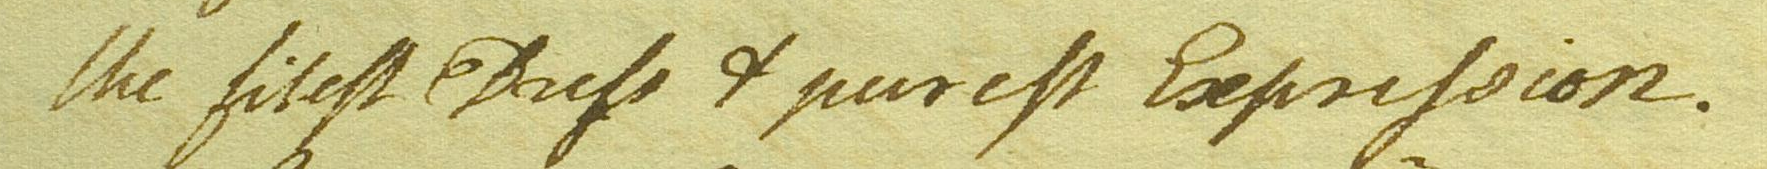the fitest Dress & purest Expression.
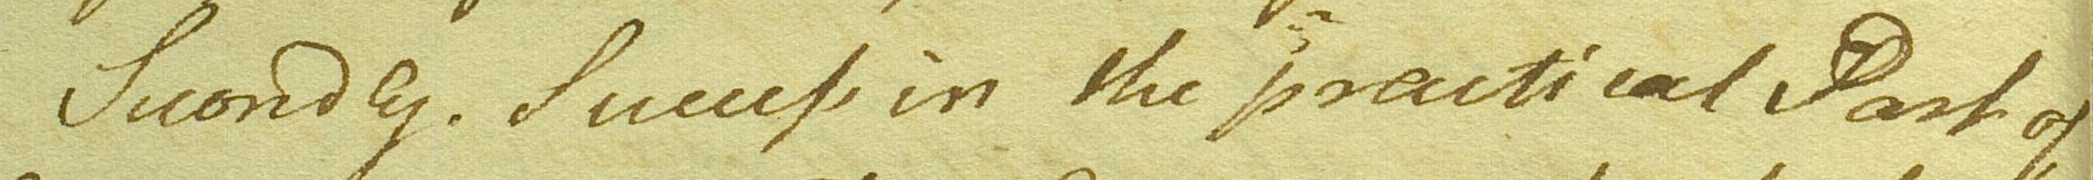Secondly. Success in the practical Part of
